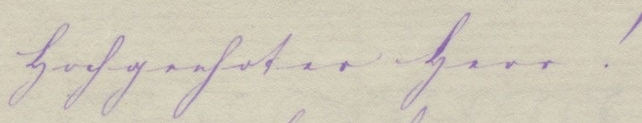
Hochgeehrter Herr!
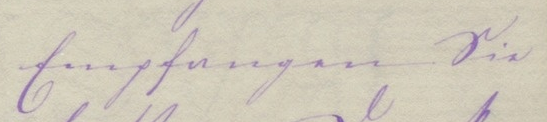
Empfangen Sie
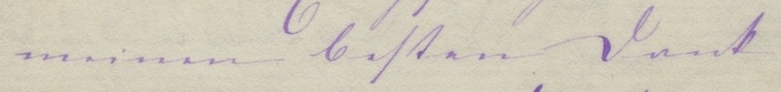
meinen besten Dank
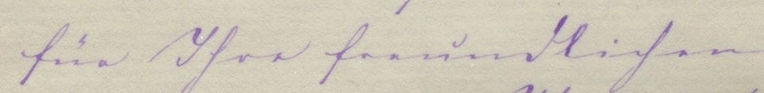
für Ihre freundlichen
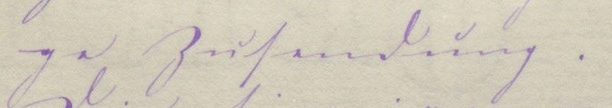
ge Zusendung.
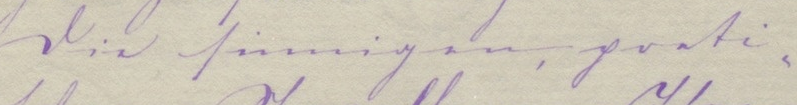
Die sinnigen, poeti-
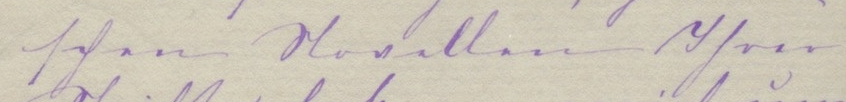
schen Novellen Ihrer
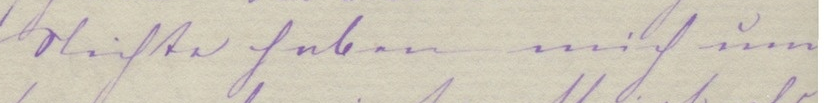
Nichte haben mich um
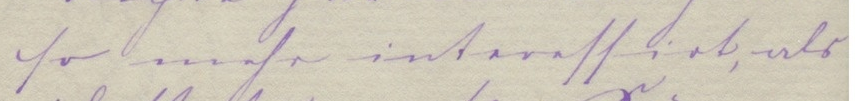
so mehr interessirt, als
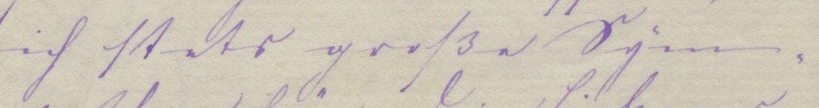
ich stets große Sym-
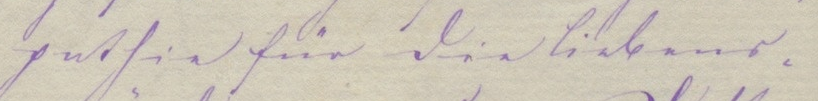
pathie für die liebens-
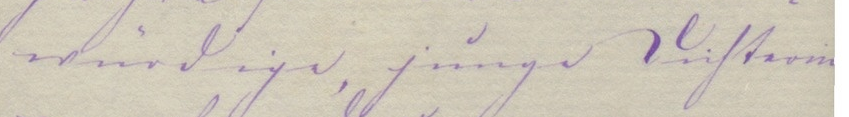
würdige, junge Dichterin
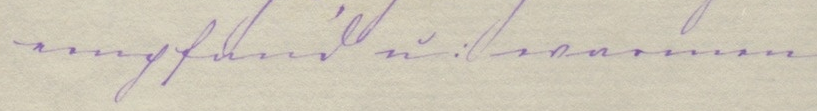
empfand u: warmen
